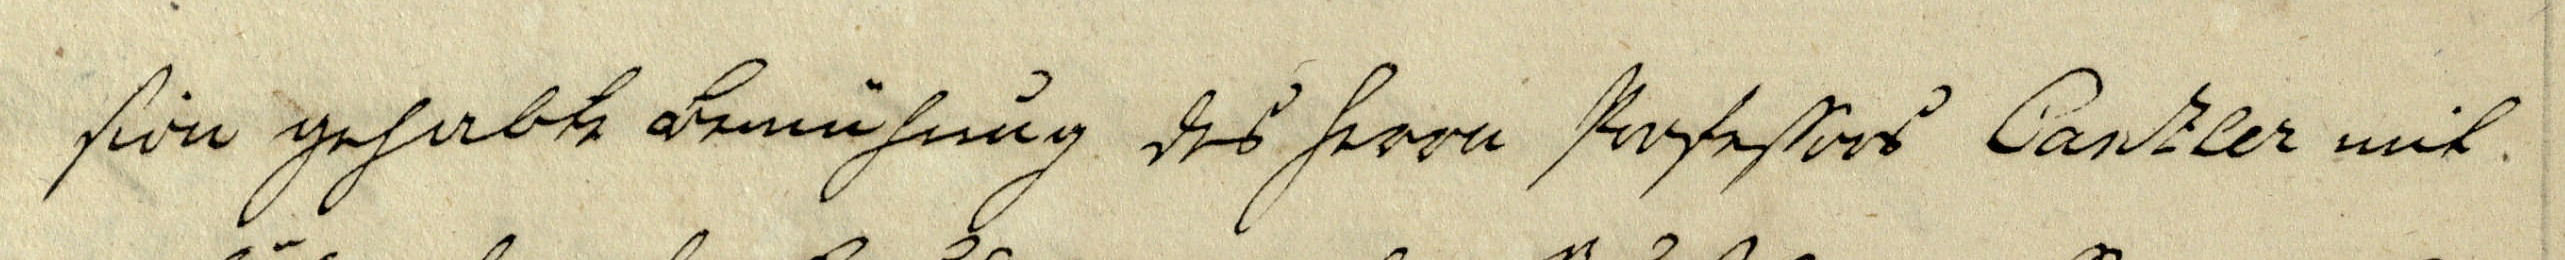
sion gehabte Bemühung des Herrn Professors Canzler mit
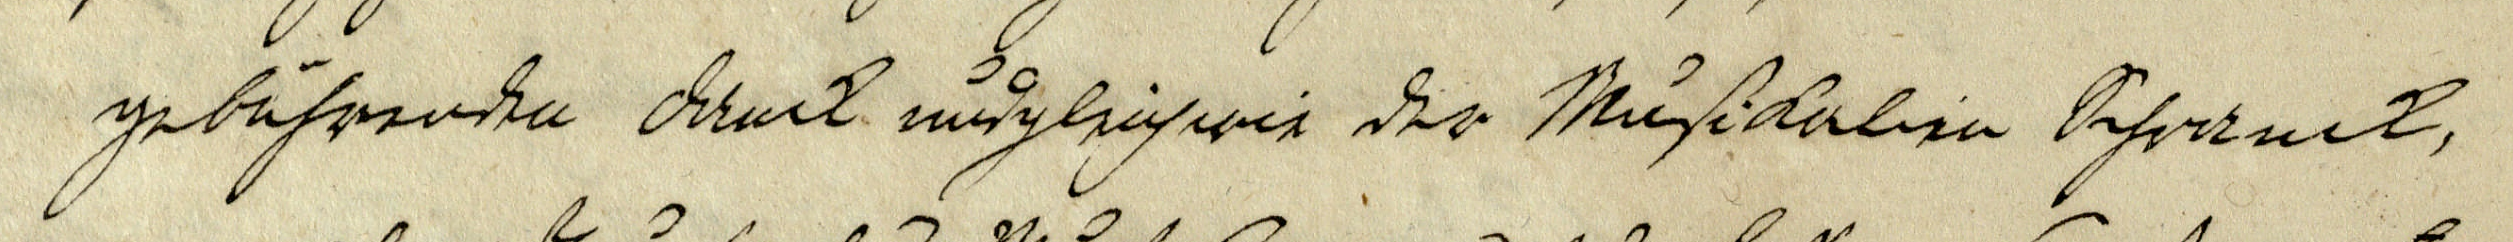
gebührenden Danck undgleichwie der Musikalien Schranck,
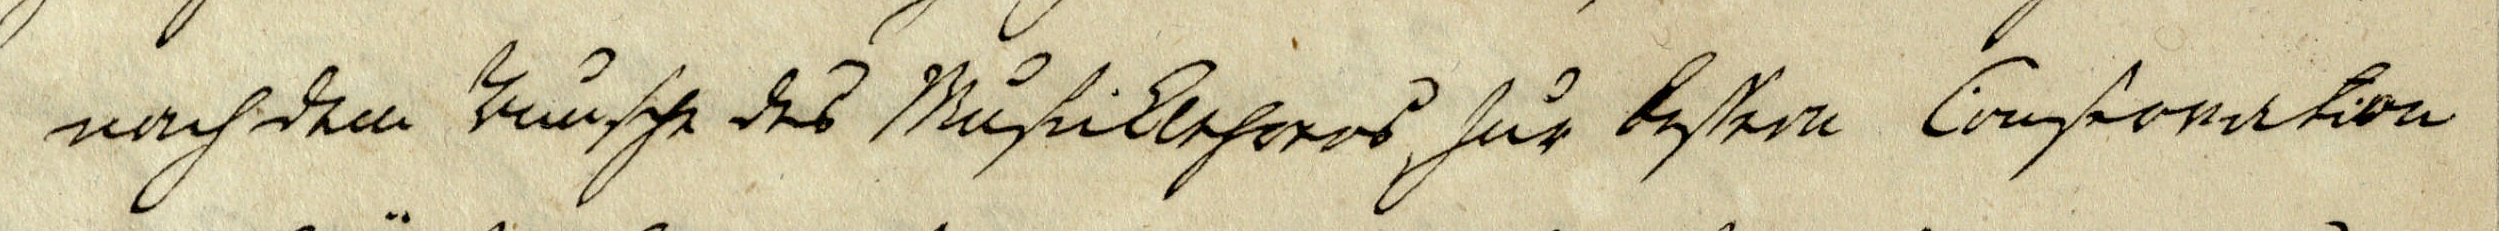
nach dem Wunsche des Musiklehrers zur bessern Conservation
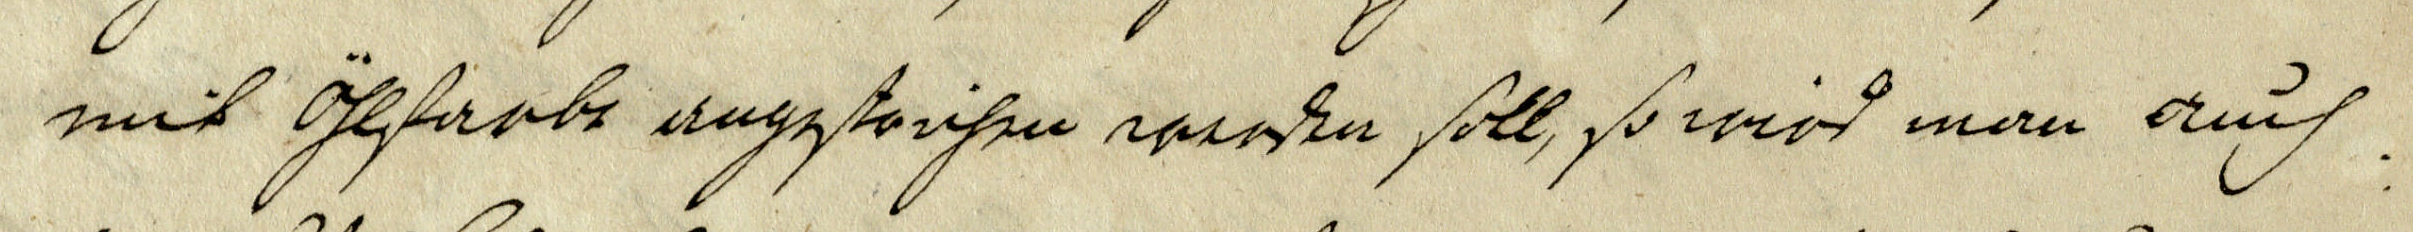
mit Öhlfarbe angestrichen werden soll, so wird man auch
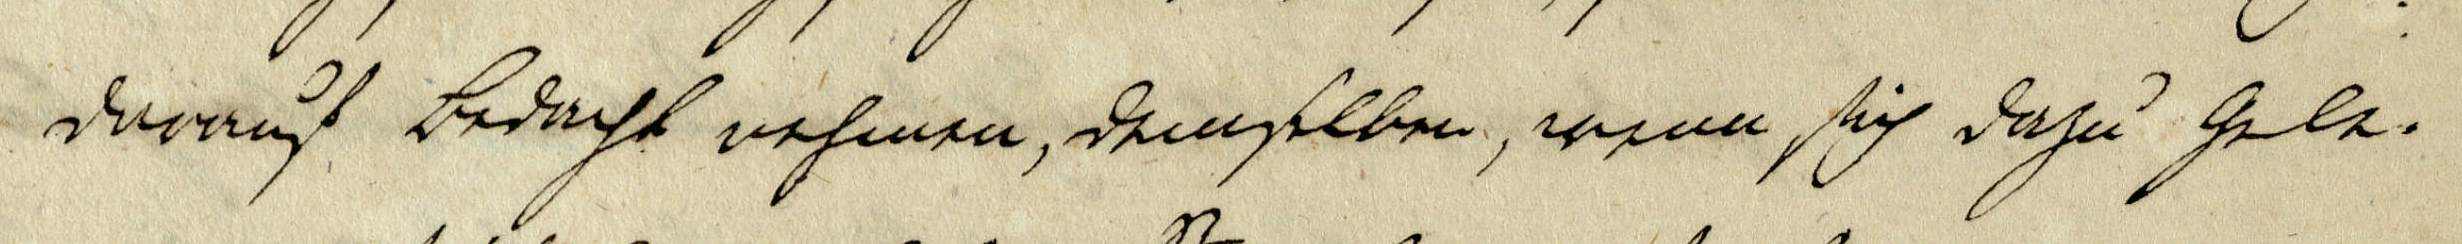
darauf Bedacht nehmen, demselben, wenn sich dazu Gele¬
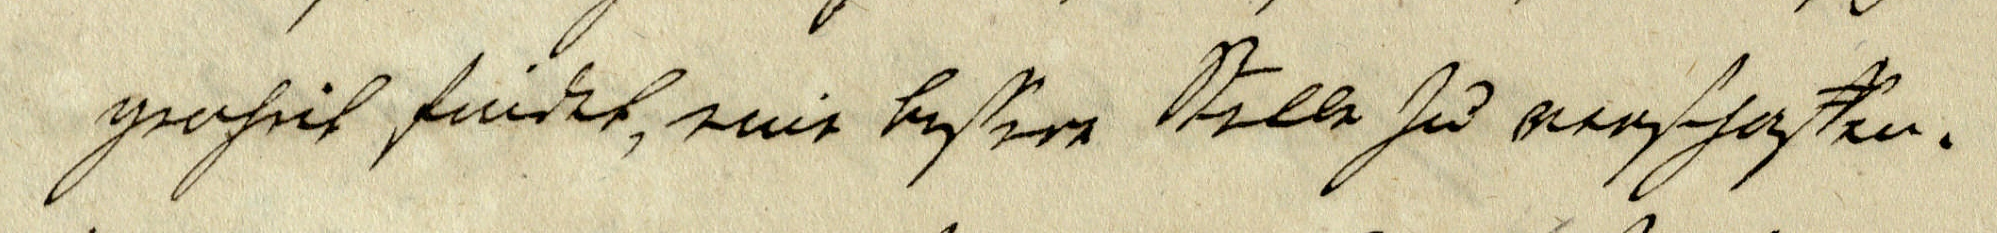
genheit findet, eine bessere Stelle zu verschaffen.
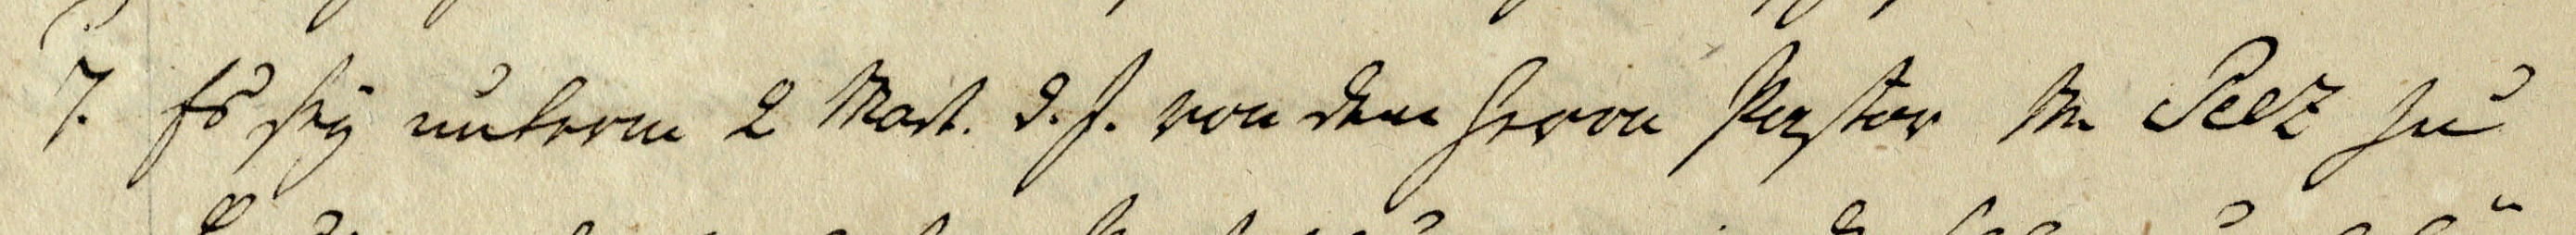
7. Es seÿ unterm 2 Mart. d. J. von dem Herrn Pastor M. Pelz zu
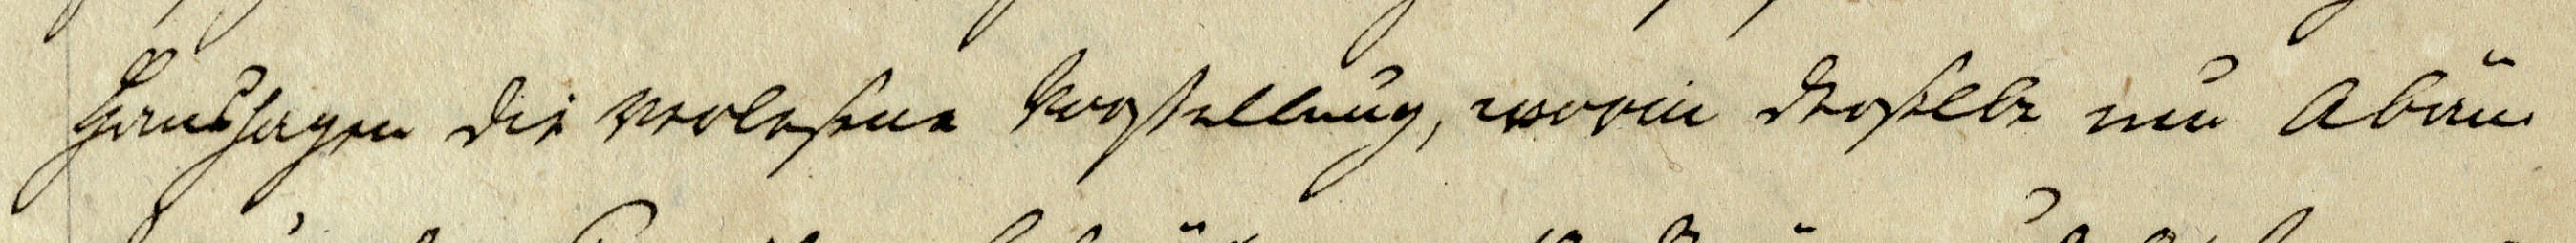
Hanshagen die verlesene Vorstellung, worin derselbe um Abän¬
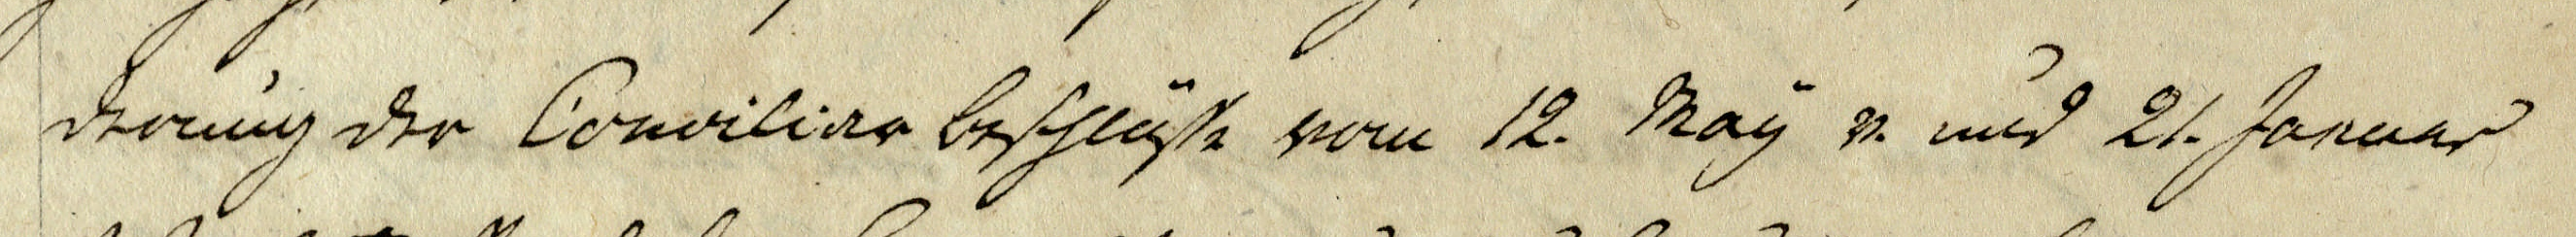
derung der Conciliar Beschlüsse vom 12. Maÿ v und 21. Januar
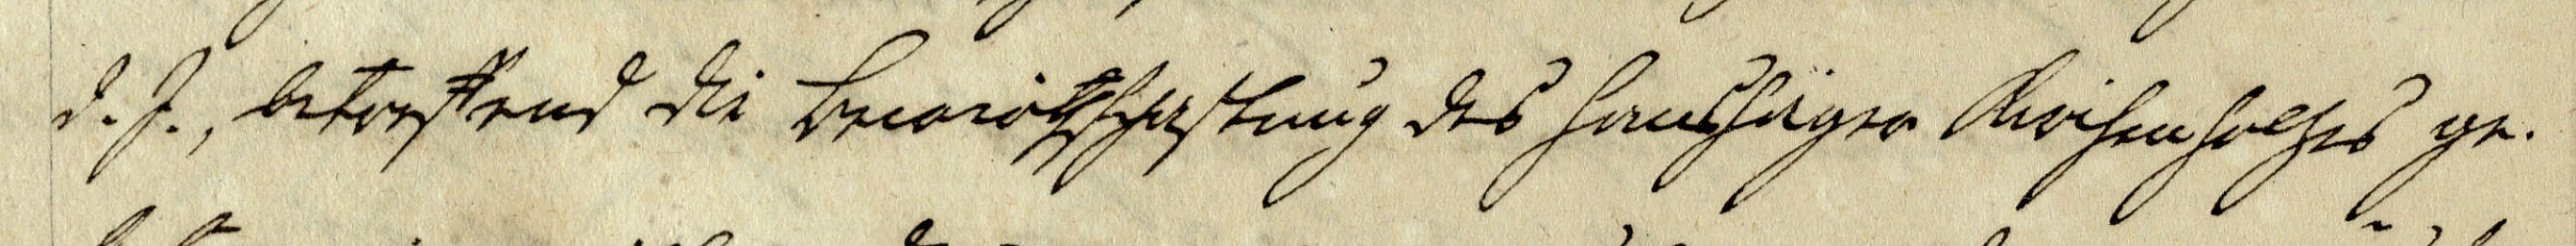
d. J., betreffend die Bewirtschaftung des Hanshäger Kirchenholzes ge¬
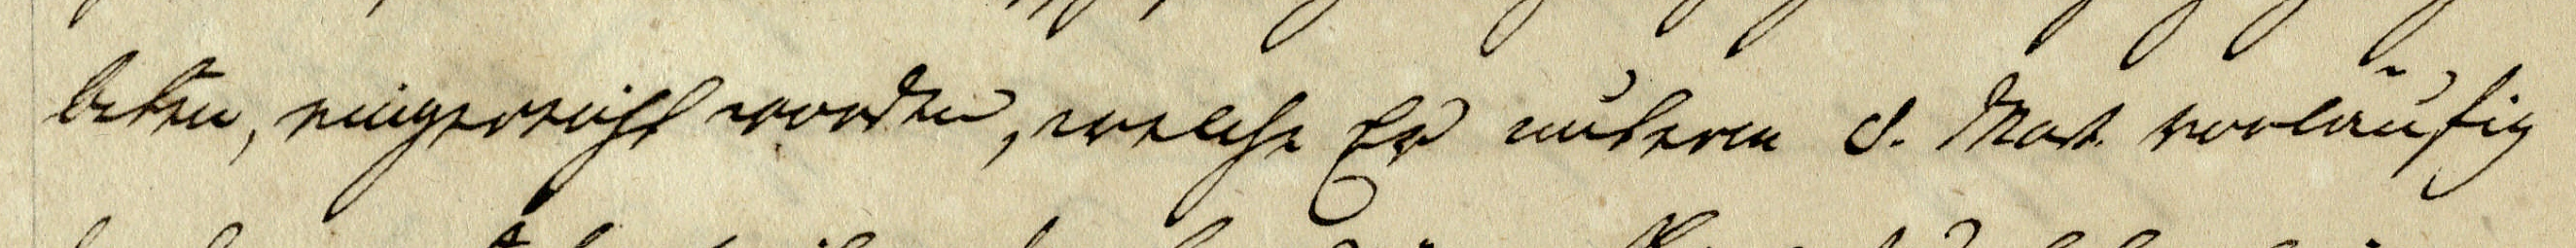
beten, eingereicht worden, welche Er unterm 8. Mart vorläufig
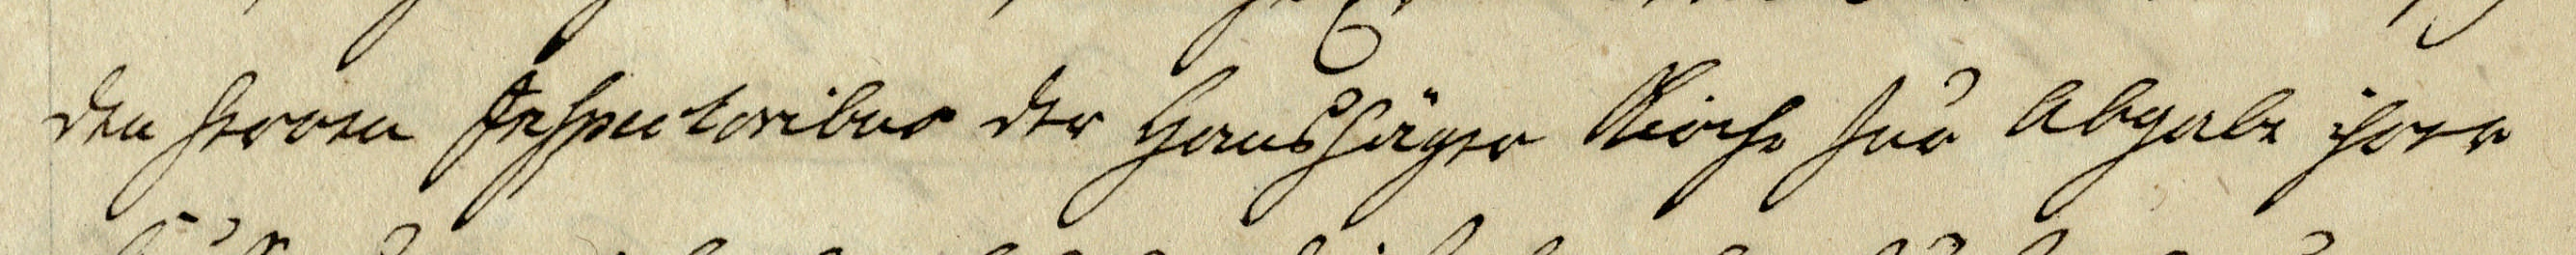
den Herren Inspectoribus der Hanshäger Kirche zur Abgabe ihrer
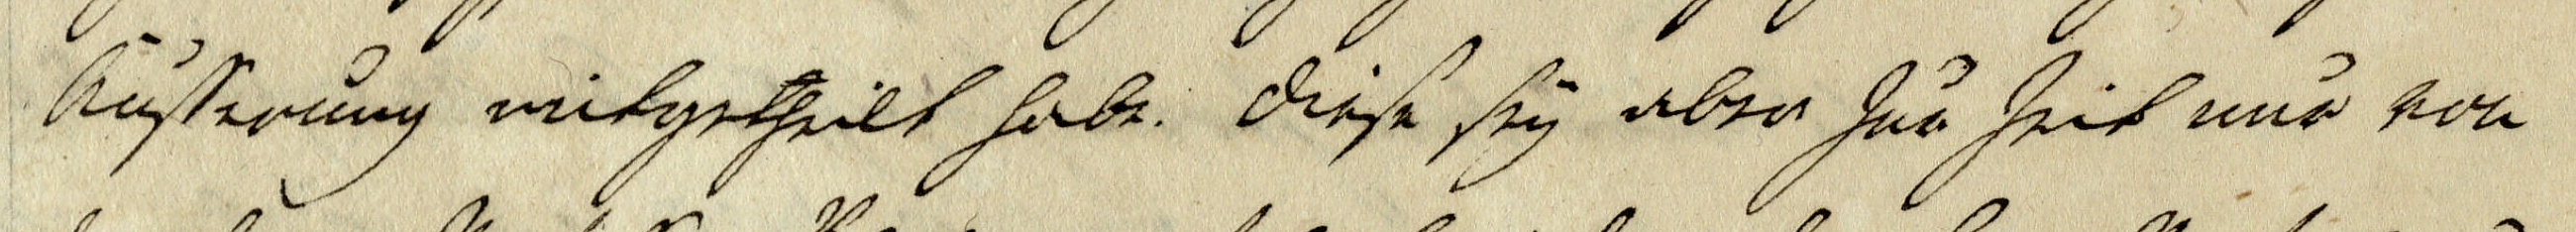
Äusserung mitgetheilt habe. diese seÿ, aber zur Zeit nur von
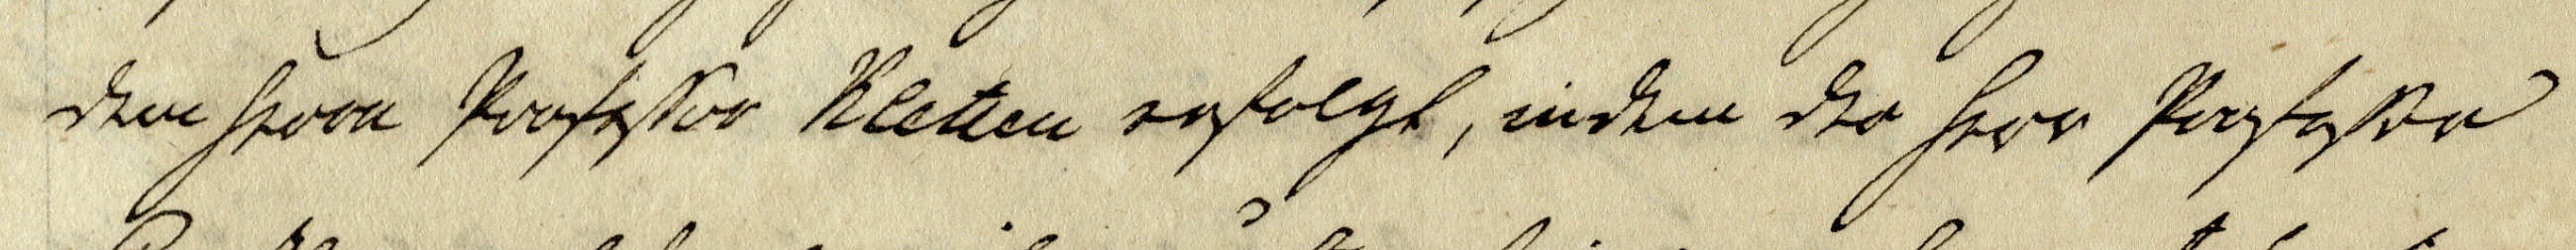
dem Herrn Professor Kletten erfolgt, indem der Herr Professor
